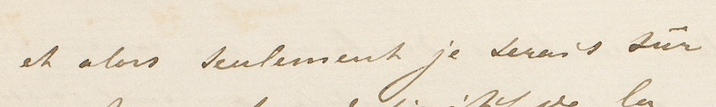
et alors seulement je serais sûr
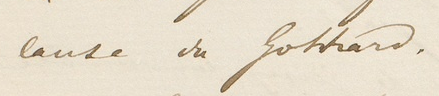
cause du Gothard.
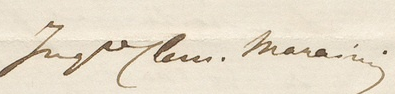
Ingre Clem. Maraini
